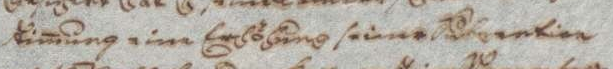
stimmung eine Erhöhung seiner Subvention
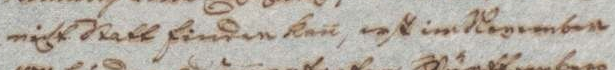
nicht Statt finden kann, erst im November
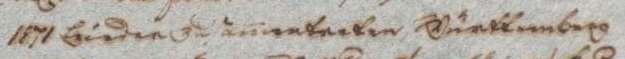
1871 wieder zusammentreten, Württemberg
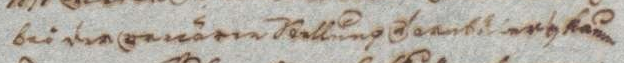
bei der precären Stellung Varnbüler's kaum
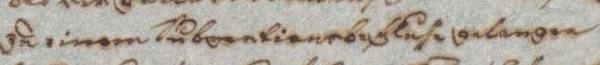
zu einem Subventionsbeschlusse gelangen
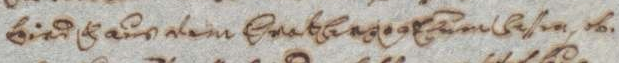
wird & aus dem Großherzogthum Hessen, ob-
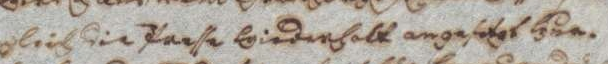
gleich die Presse wiederholt angesetzt wur-
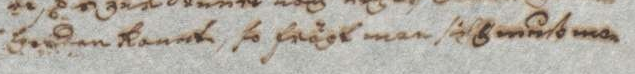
werden konnte, so frägt man sich & muß man
